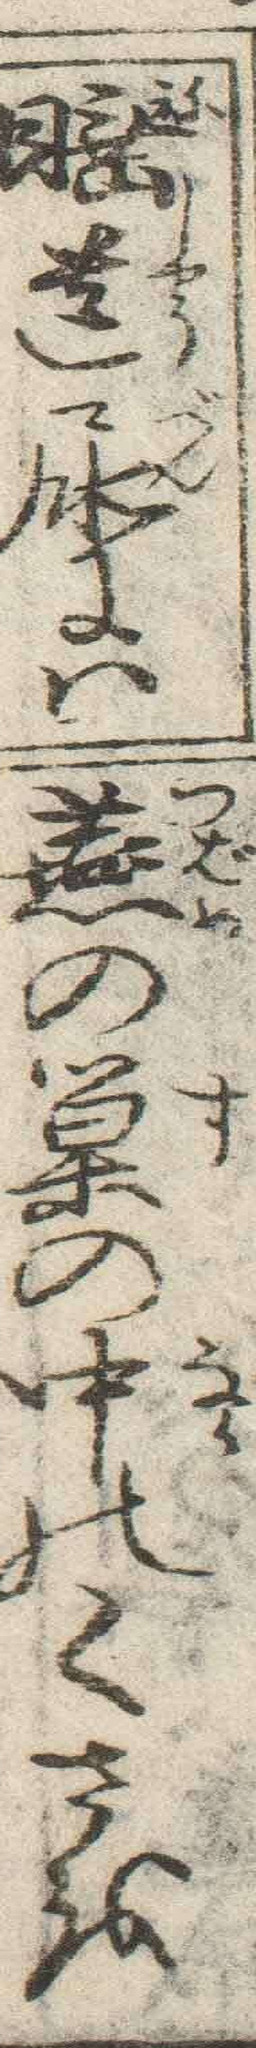睡遺尿には燕の巣の中のくさを
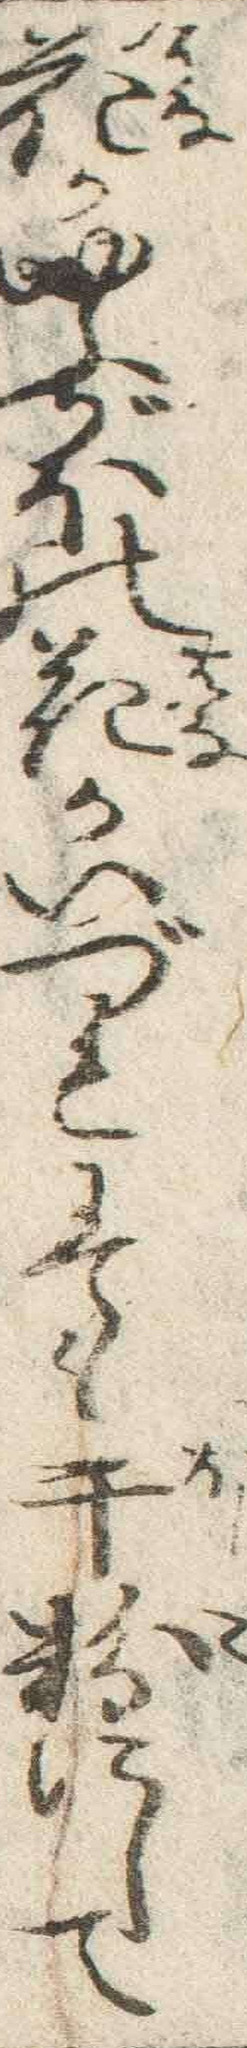花かゆうがほの花かいづれにても干粉にして
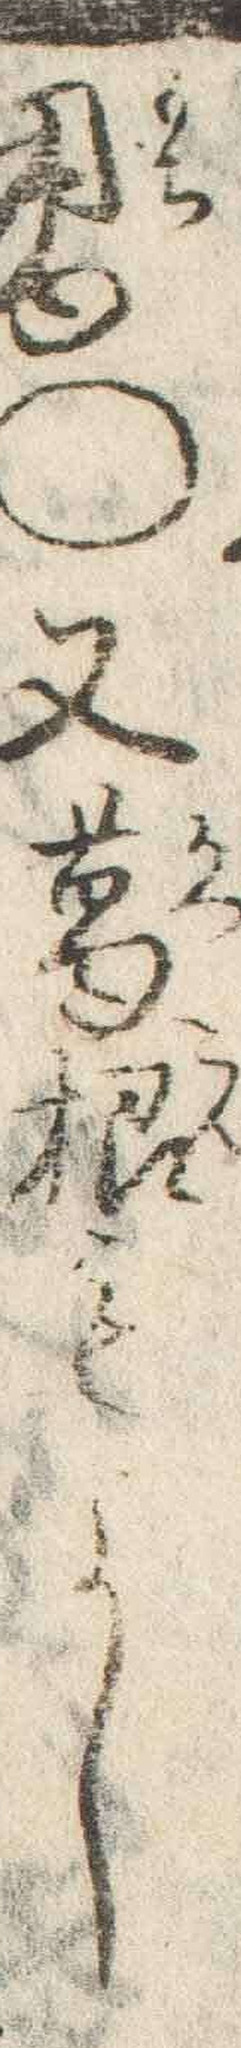用ゆ○又葛根もよし
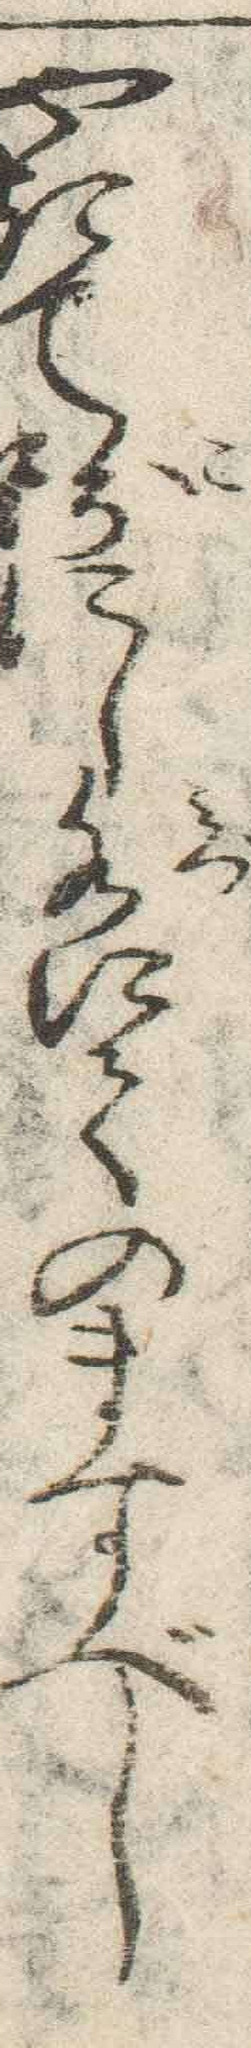やきて粉にし水にてのますべし
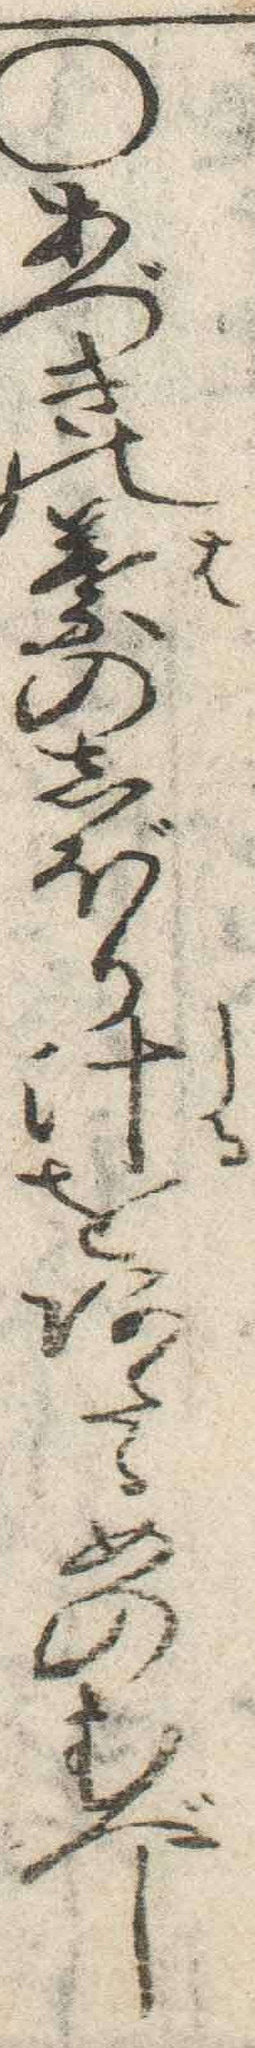○あづきの葉のしぼり汁をあたゝめのむべし
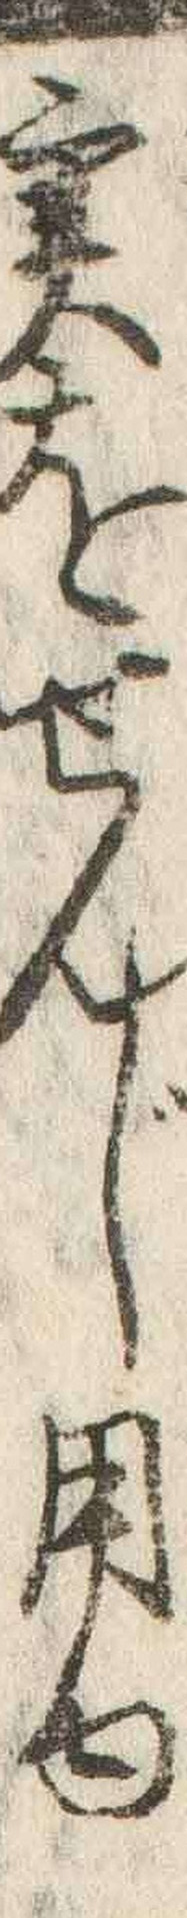実をせんじ用ゆ
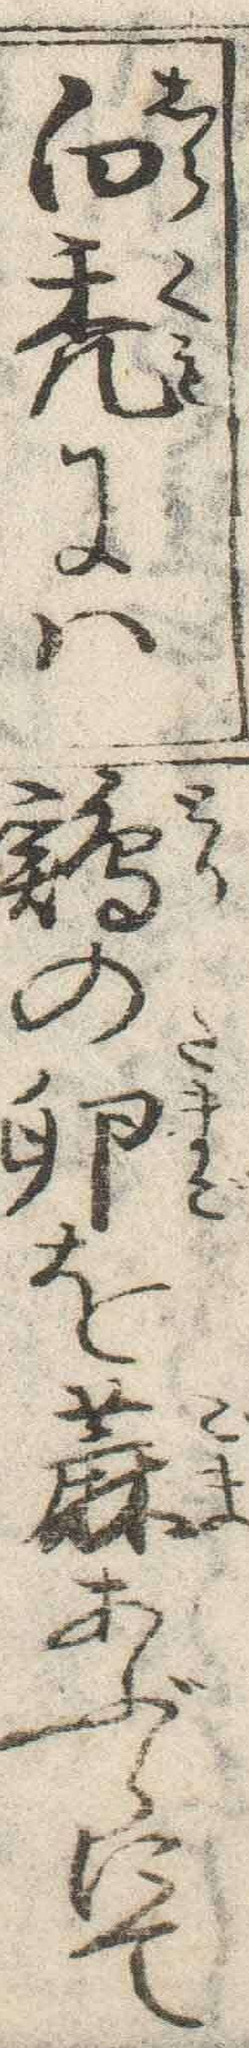白禿には鶏の卵を蔴あぶらにて
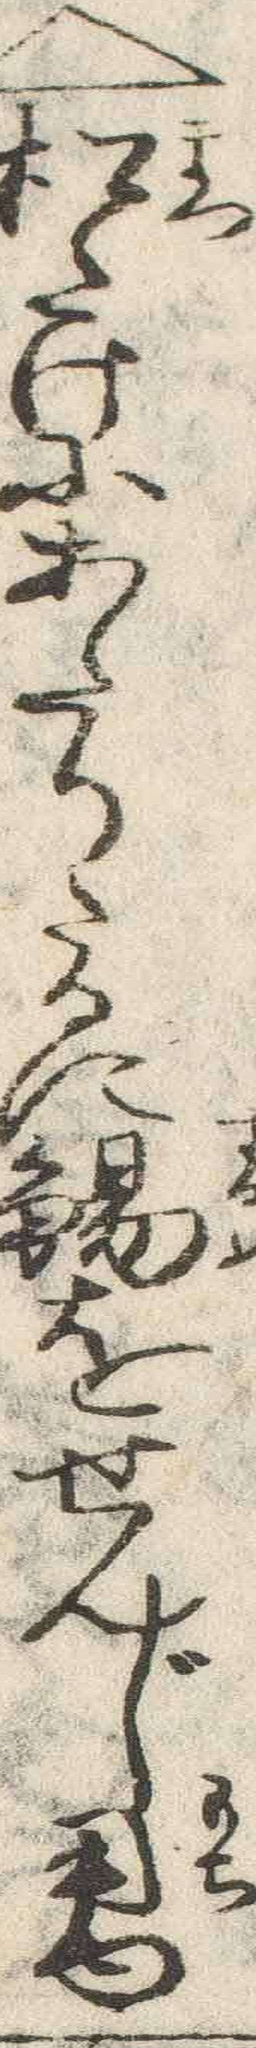△松たけにあたりたるに鰑をせんじ用ゆ
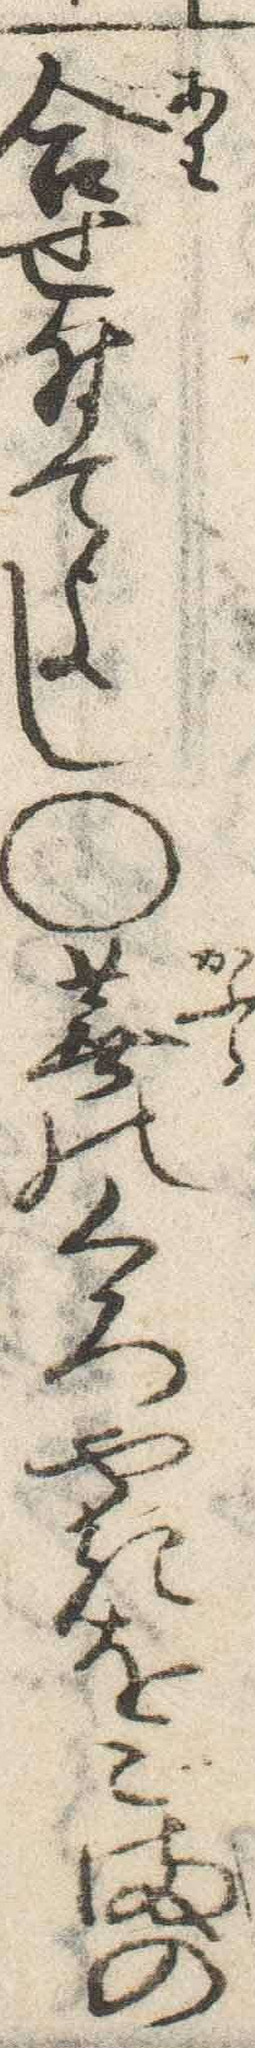合せ付てよし○蕪のくろやきをごまの
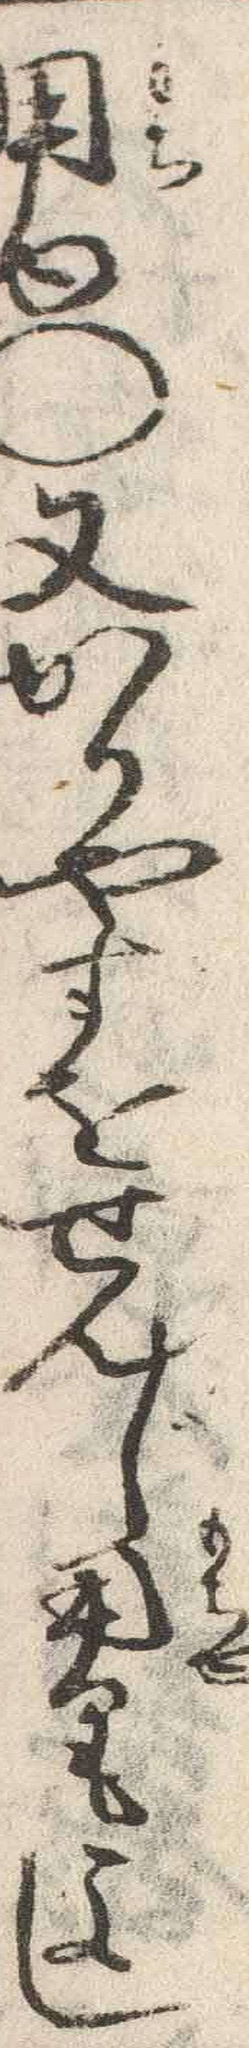用ゆ○又かりやすをせんじ用るもよし
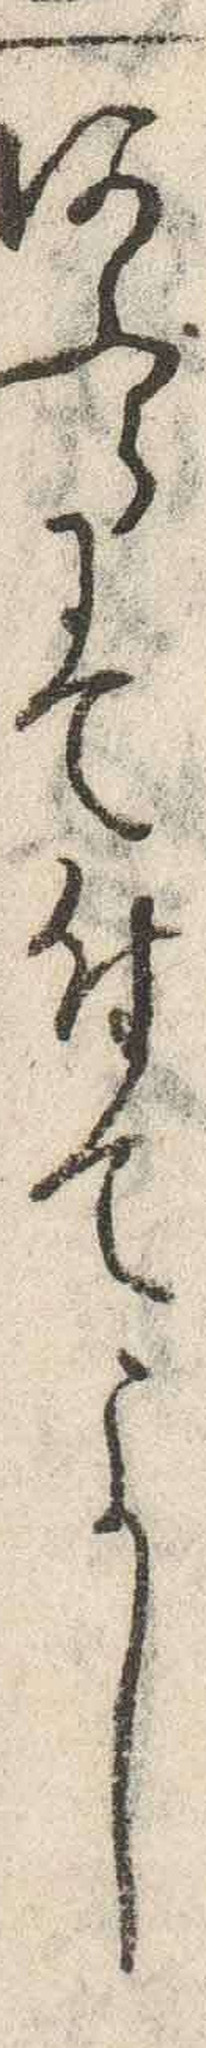あぶらにて付てよし
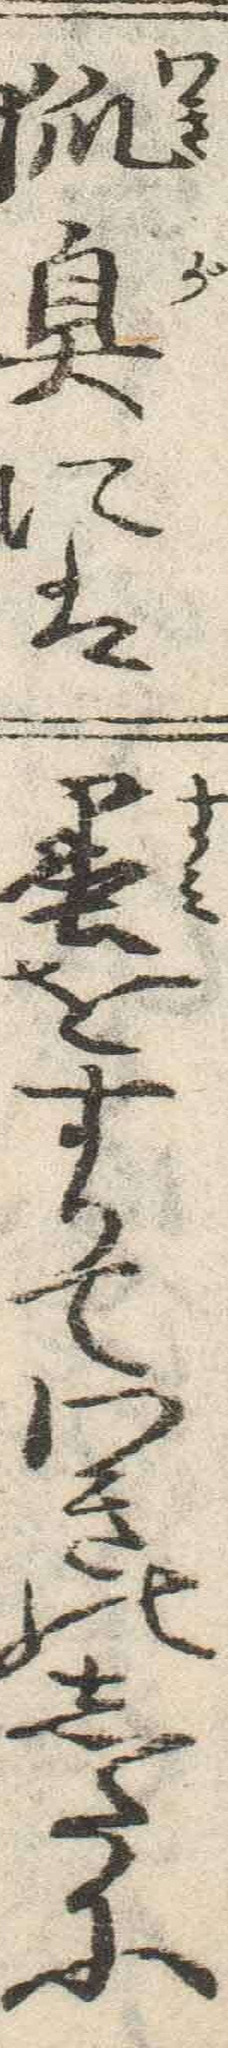狐臭には墨をすりてわきのしたに
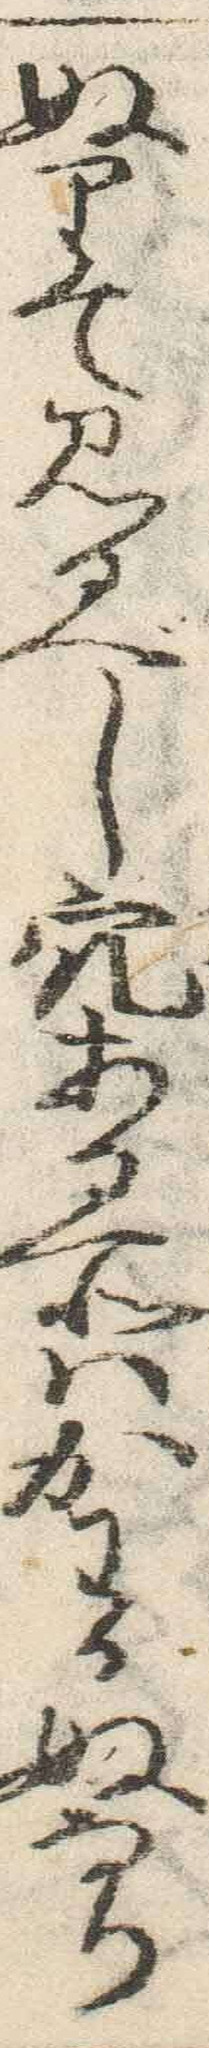ぬりて見るべし穴ある所はかわかぬなり
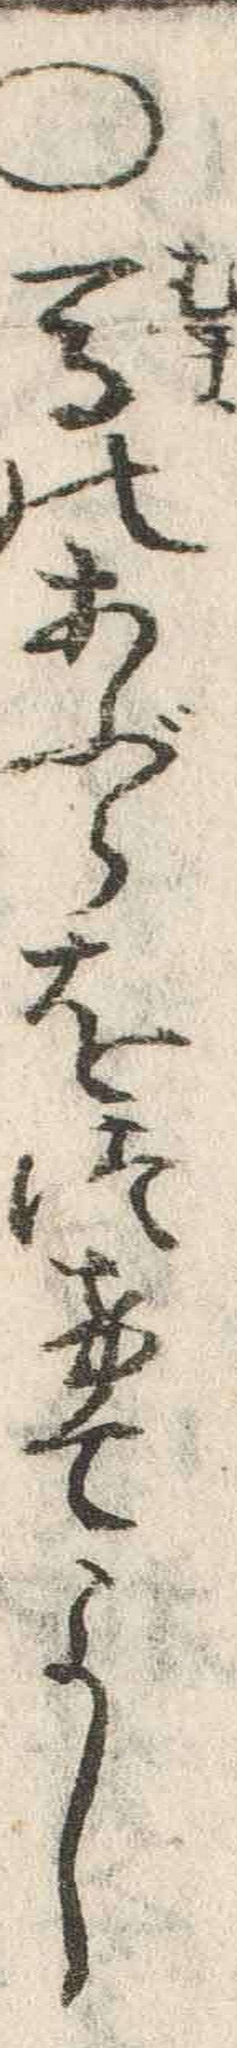○馬のあぶらをつけてよし
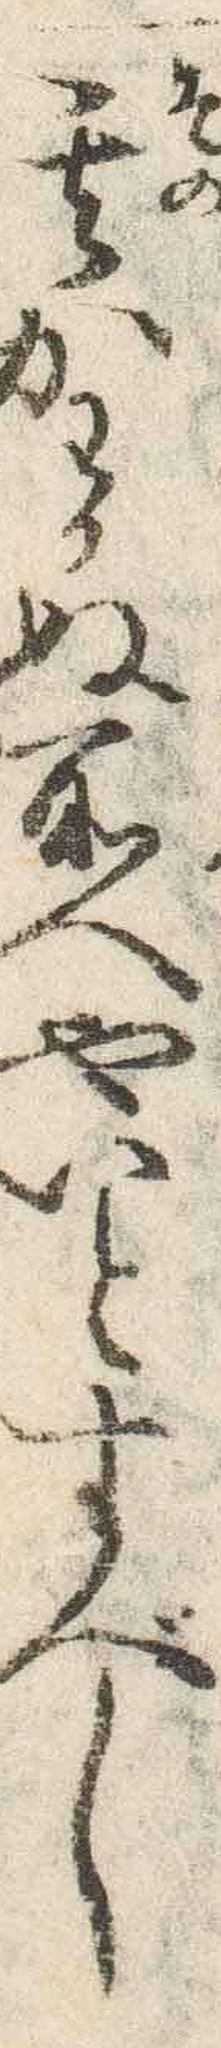其かわかぬ所へやいとすべし
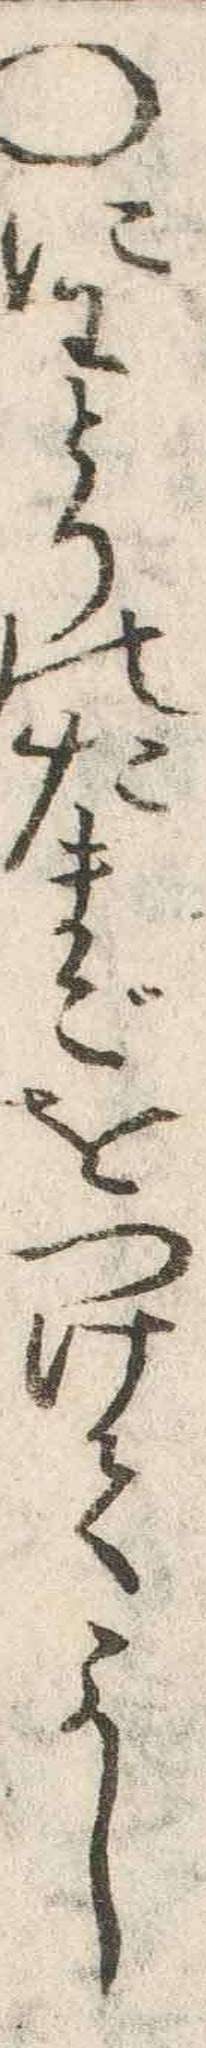○にわとりのたまごをつけてよし
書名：撫育草
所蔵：東京学芸大学附属図書館 国文学研究資料館
